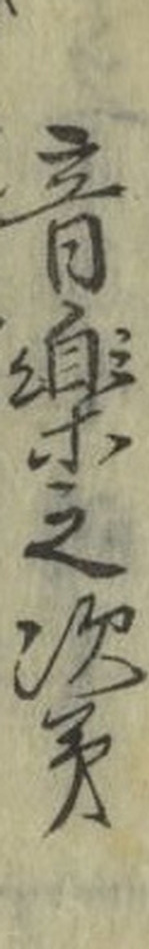音樂之次第
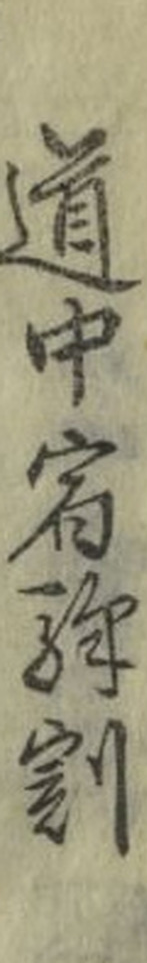道中宿驛割
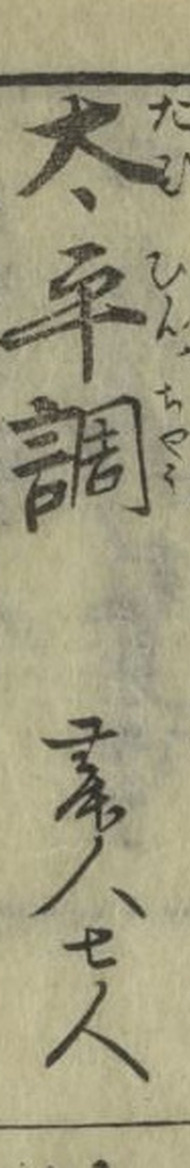大平調舞人七人
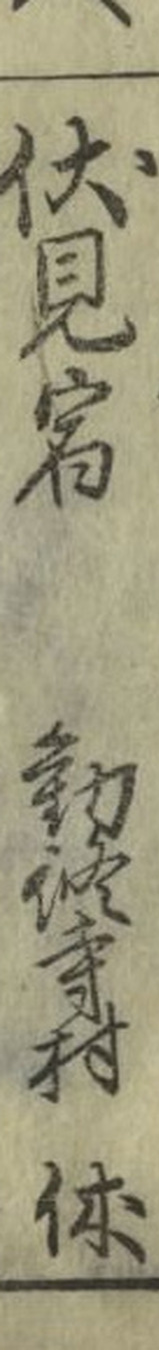伏見宿勧修寺村休
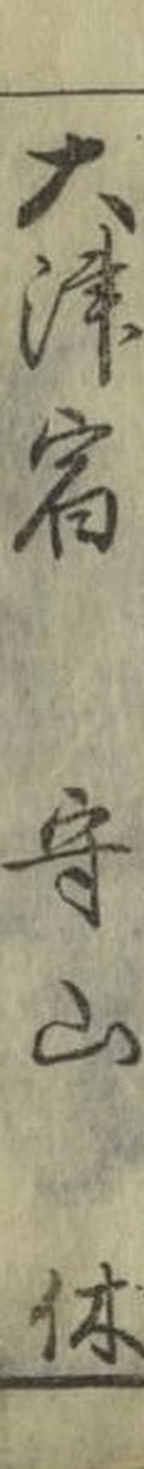大津宿守山休
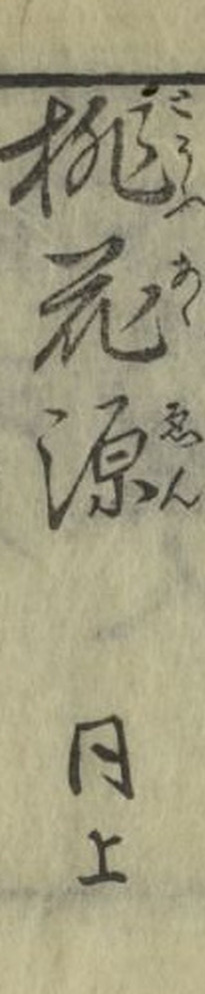桃花源同上
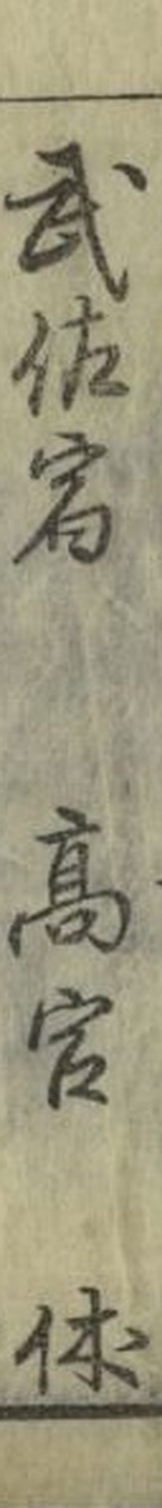武佐宿高宮休
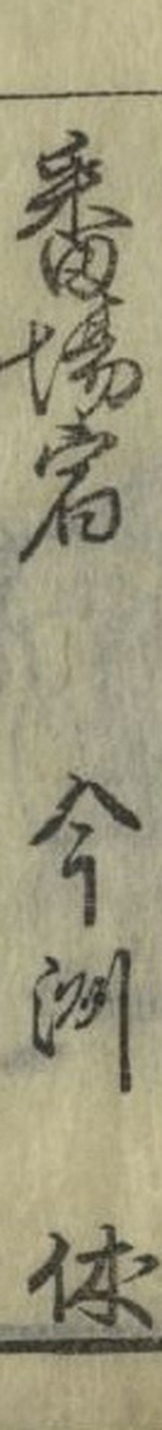番場宿今洲休
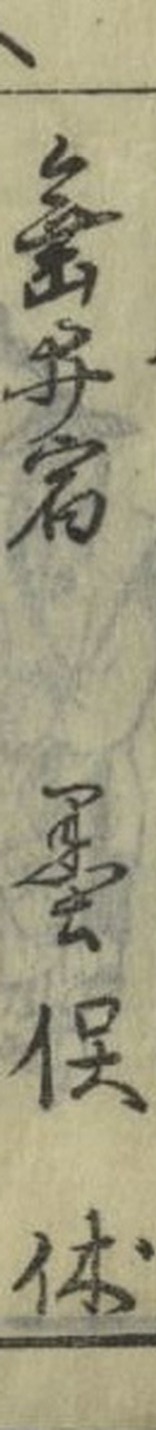垂井宿墨俣休
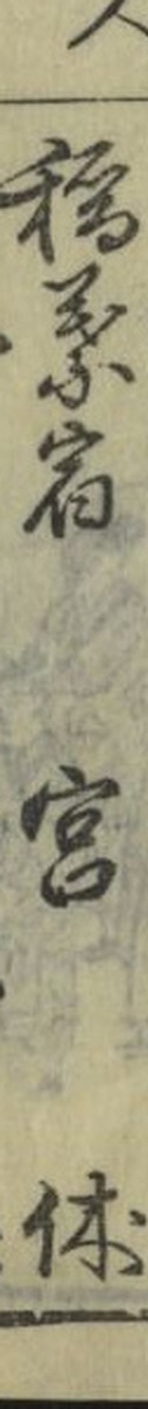稲葉宿宮休
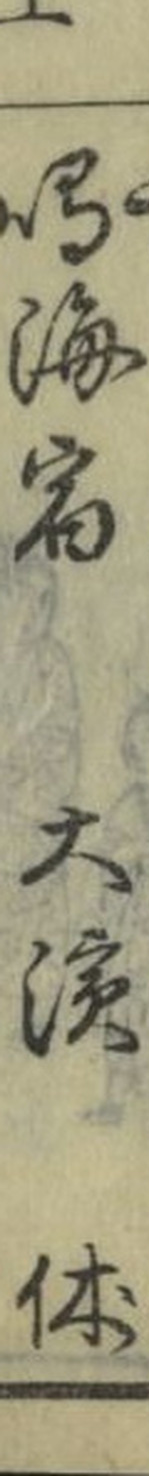鳴海宿大濱休
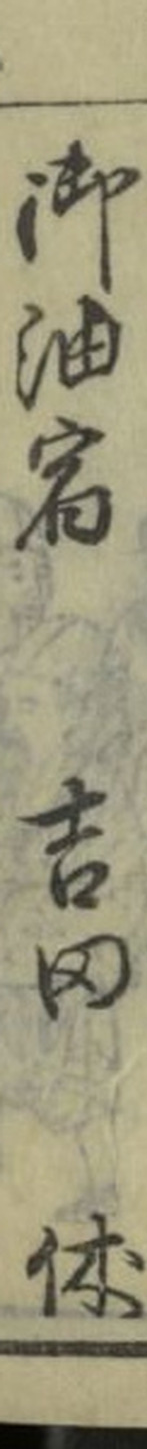御油宿吉田休
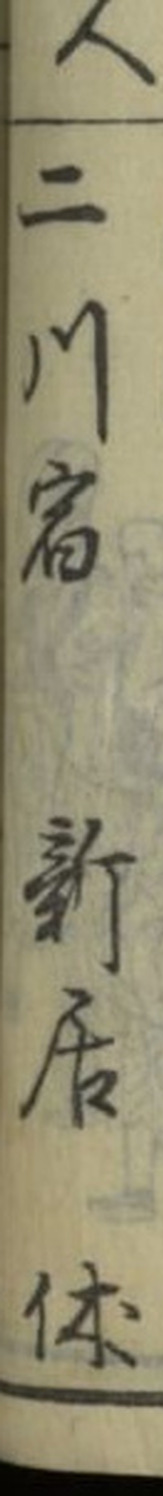二川宿新居休
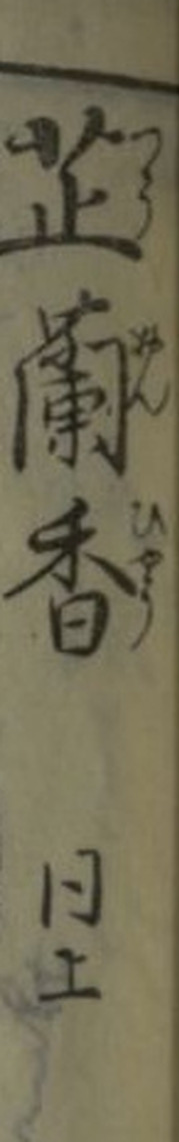芷蘭香同上
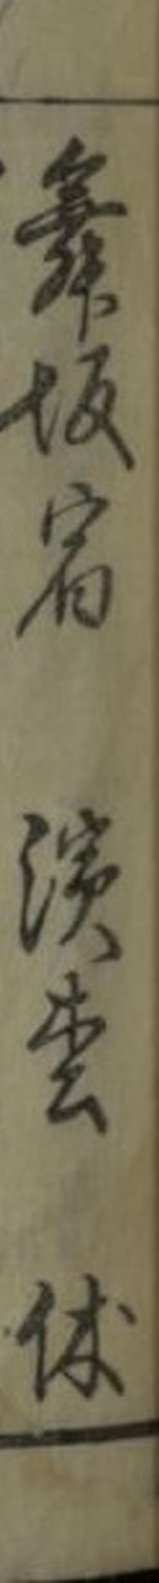舞坂宿濱松休
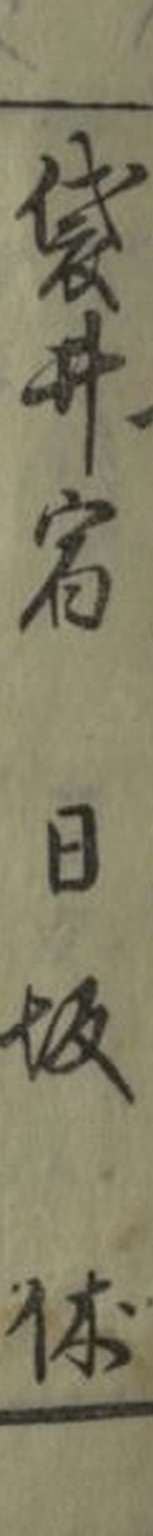袋井宿日坂休
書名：新板 琉球人行列記
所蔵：University of the Ryukyus Library
